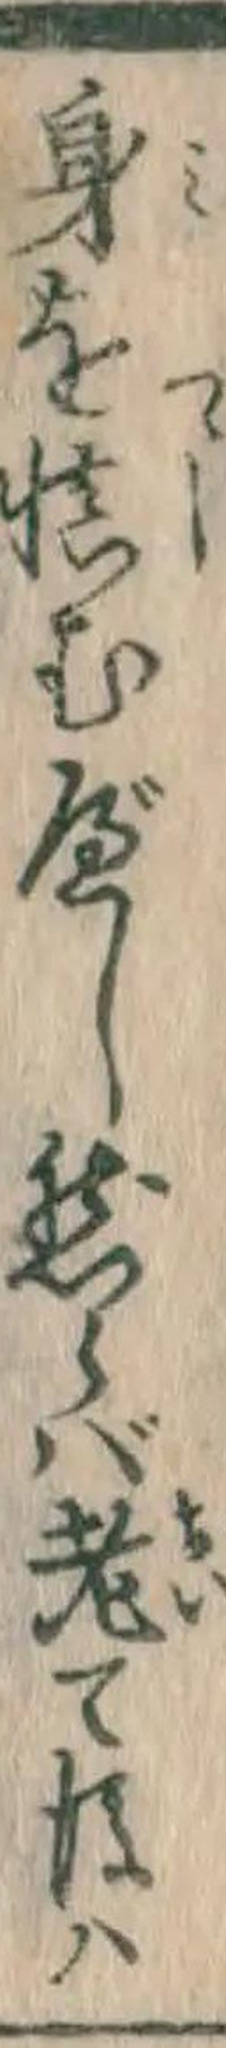身を慎むべし然らば老て後は
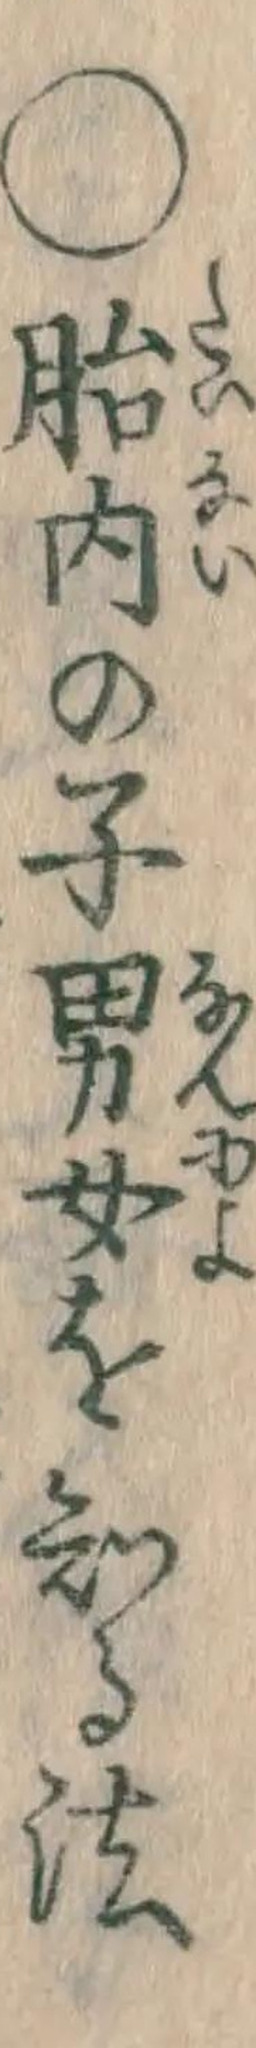○胎内の子男女を知る法
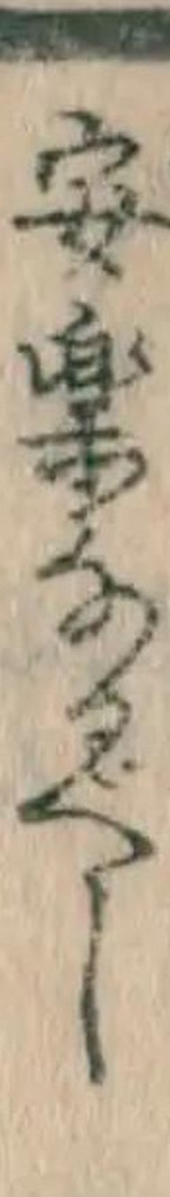安楽なるべし
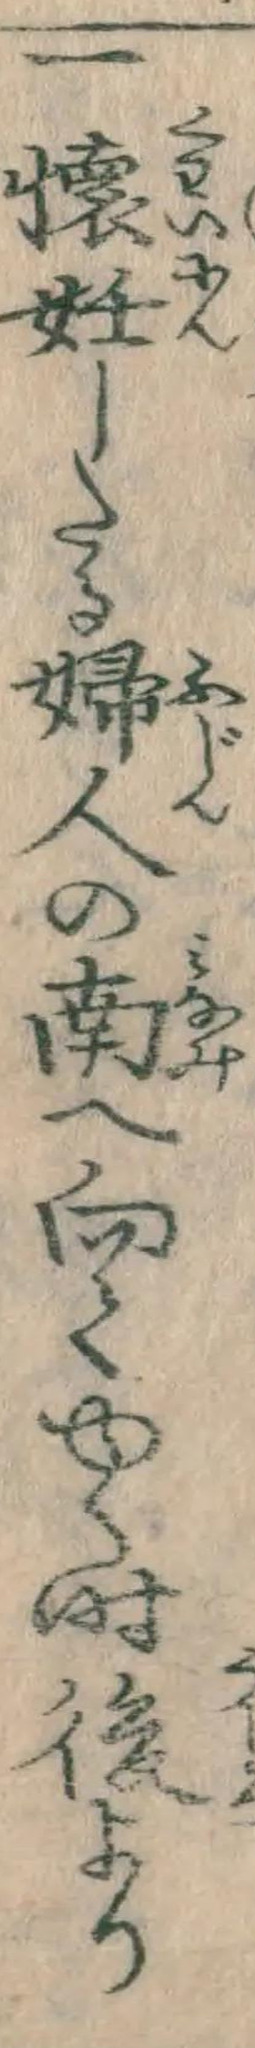一懐妊したる婦人の南へ向てゆく時後より

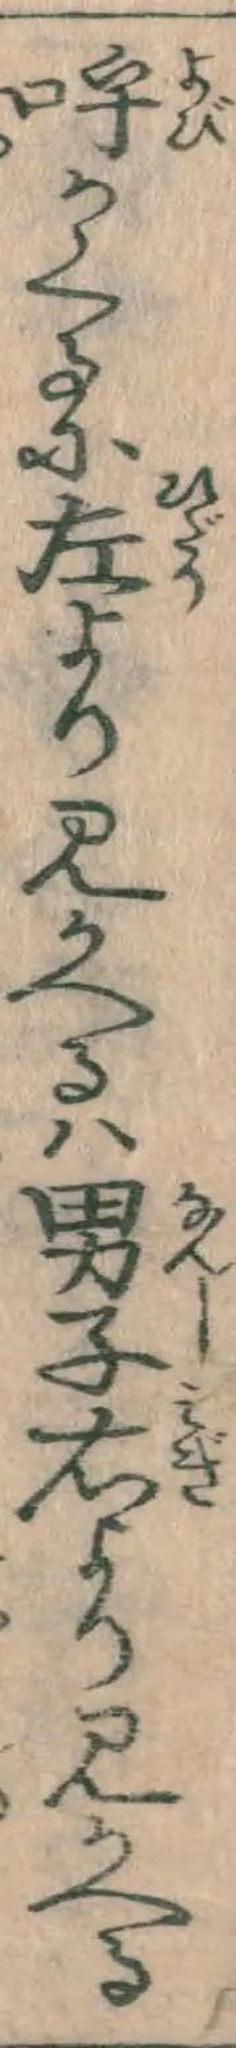呼かくるに左より見かへるは男子右より見かへる
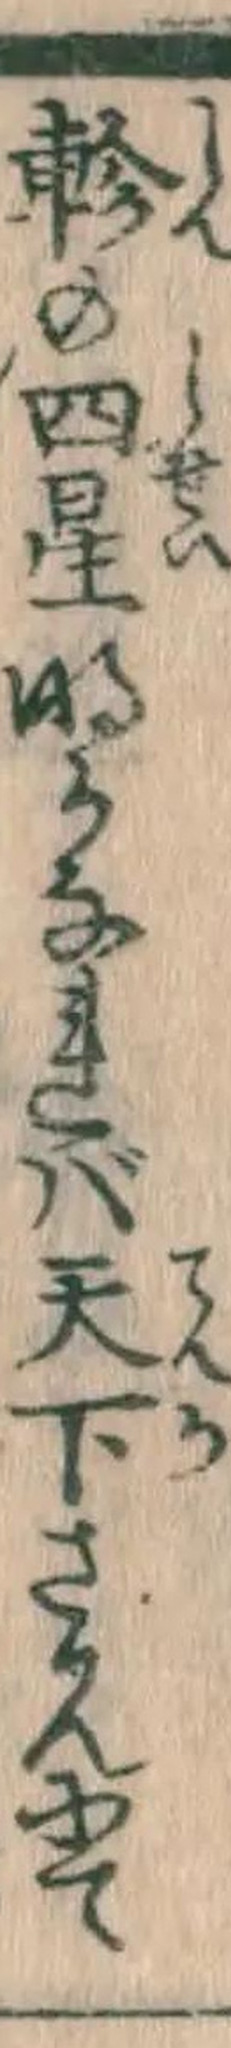軫の四星明かなれば天下さかんにて
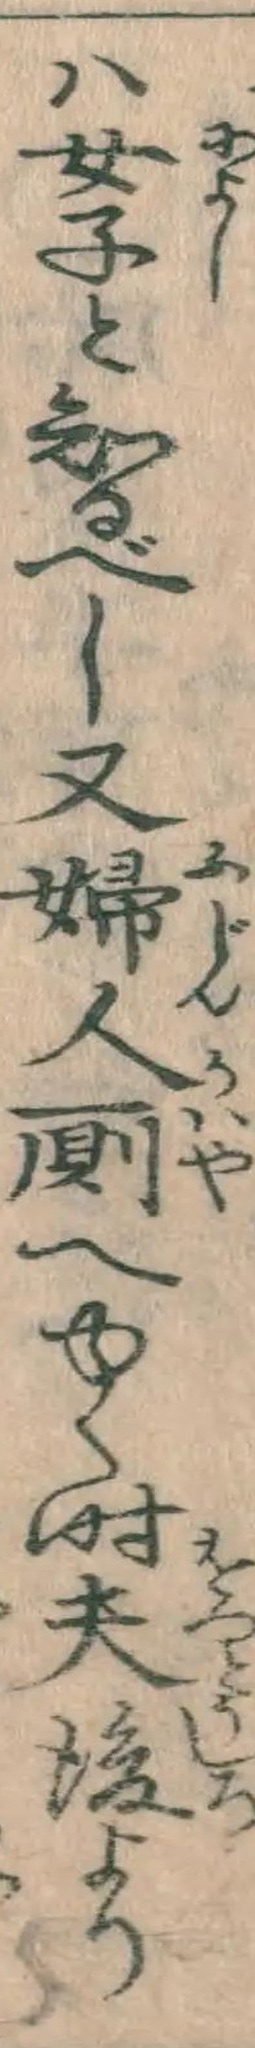は女子と知るべし又婦人厠へゆく時夫後より
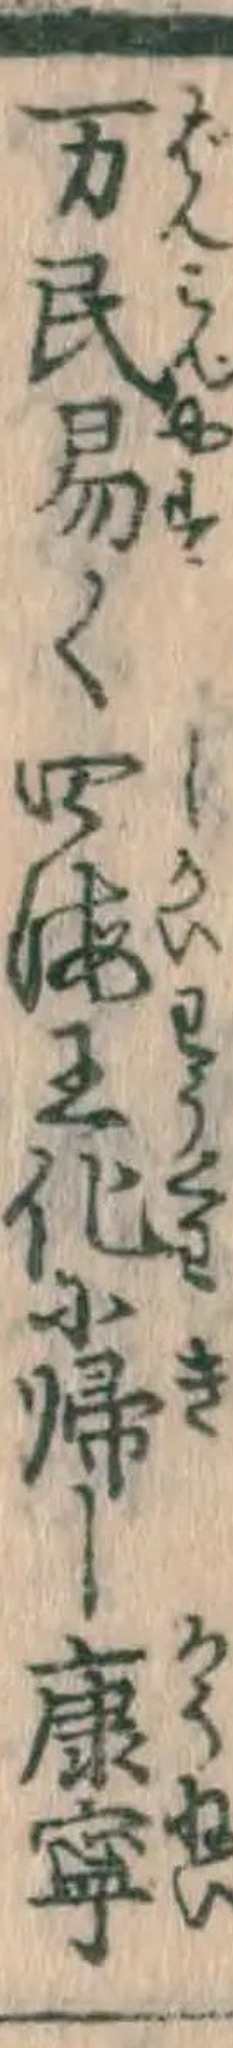万民易く四海王化に帰し康寧
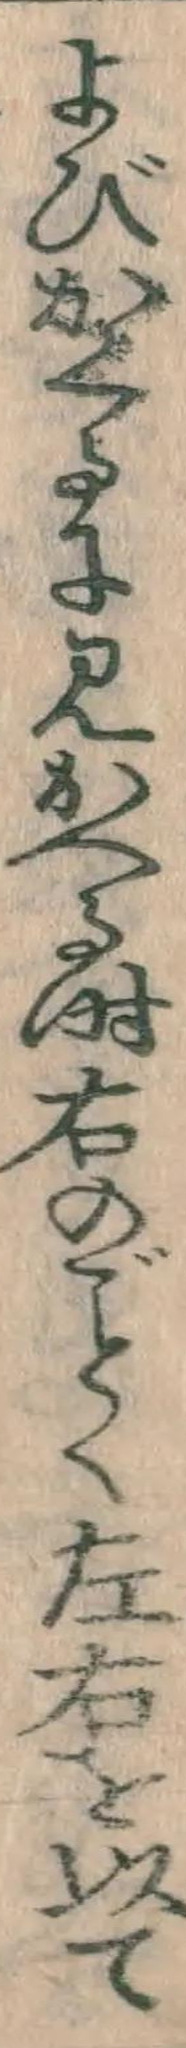よびかくるに見かへる時右のごとく左右を以て
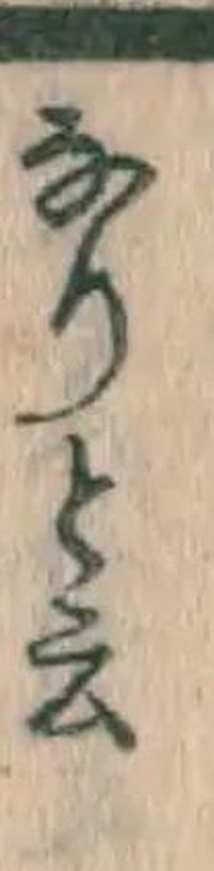なりと云
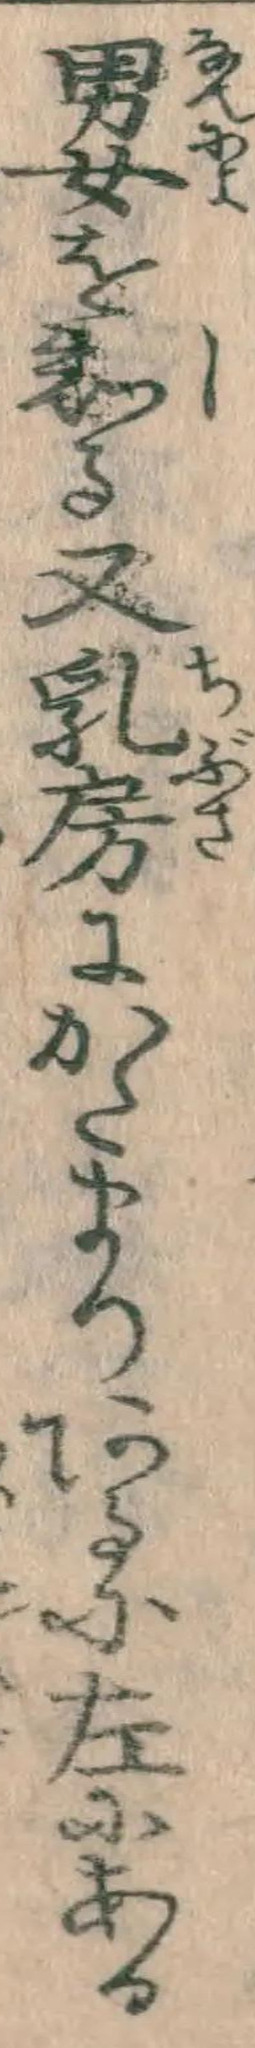男女を知る又乳房にかたまりあるに左にある
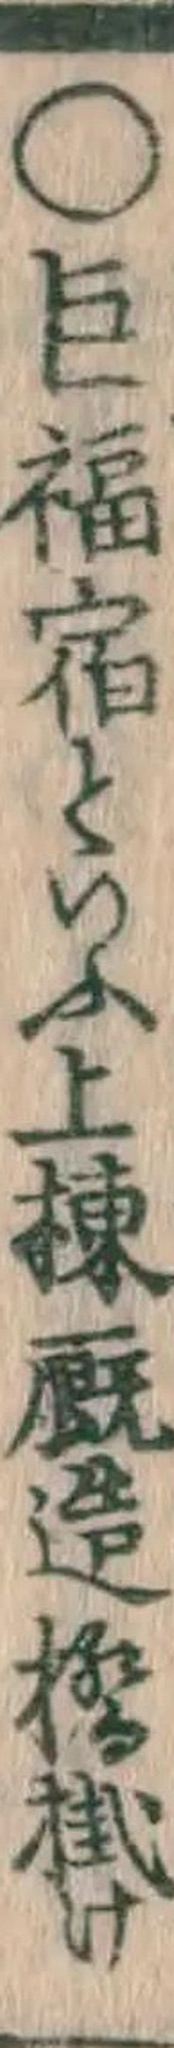○巨福宿といふ上棟厩造橋掛け
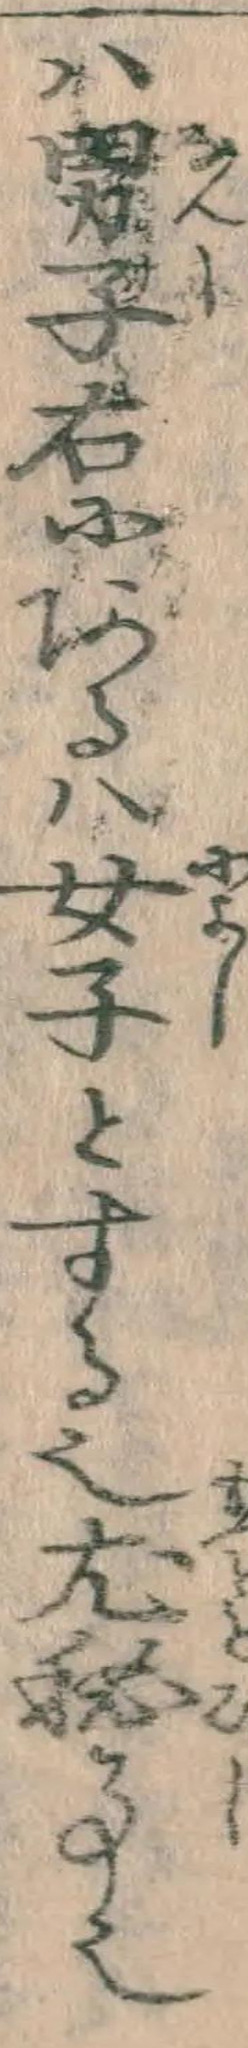は男子右にあるは女子とする也尤秘事也
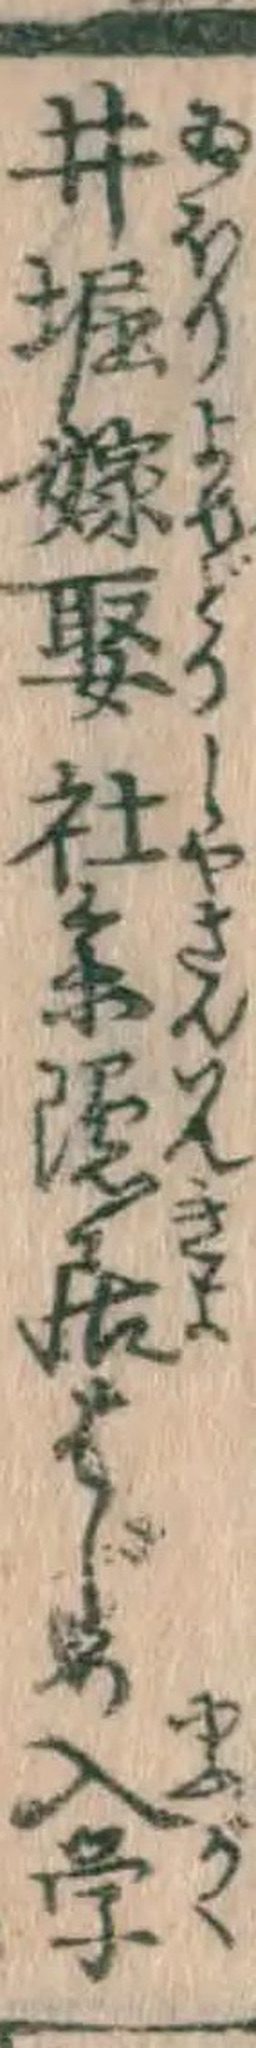井堀嫁娶社参隠居はじめ入学
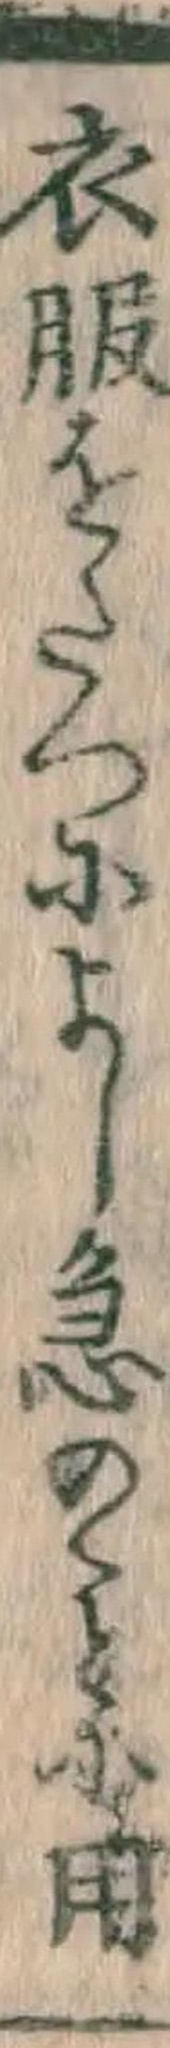衣服をたつによし急のことに用
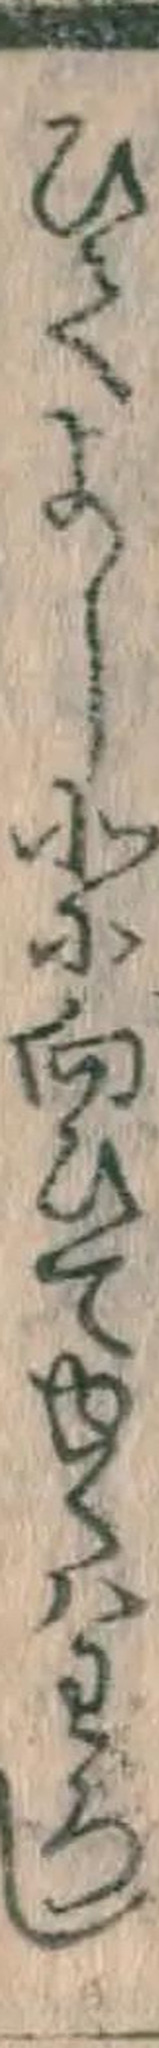ひてよし北に向ひてゆくはわろし
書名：広益秘事大全 3巻. [2]
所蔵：国立国会図書館 National Diet Library, JAPAN
